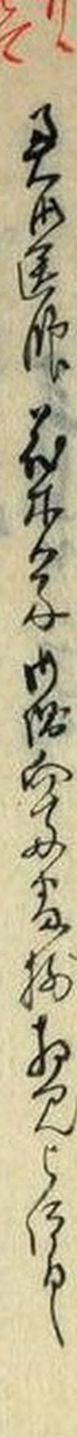奥御医師花木栄御側向当番揃拝見被仰付候
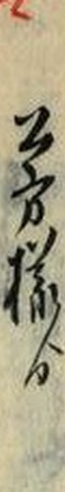公方様ゟ
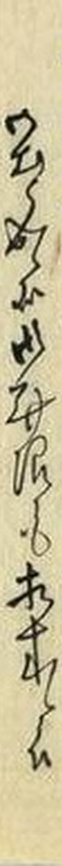外ニ思召御出被成候処御刻限も相成候付
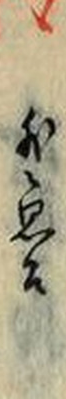外ニ思召
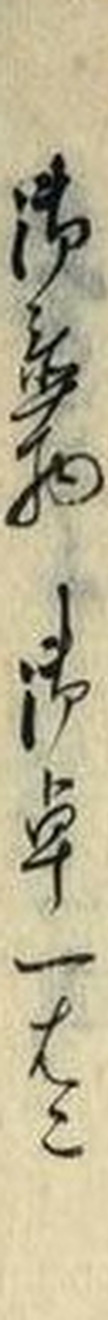御文台御硯一はこ
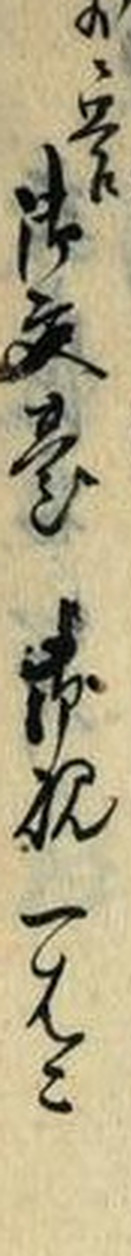御文台御硯一はこ

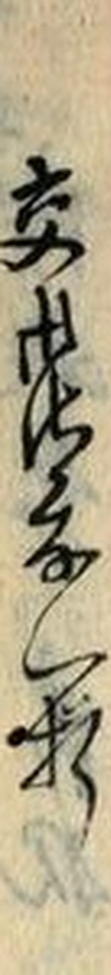交御肴一折
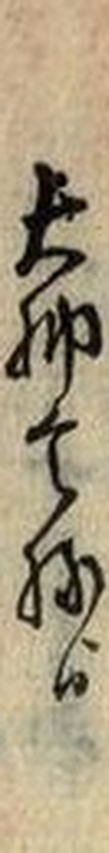大納言様ゟ
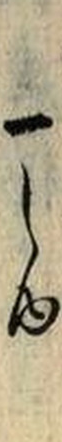一之内
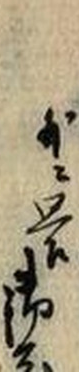外ニ思召
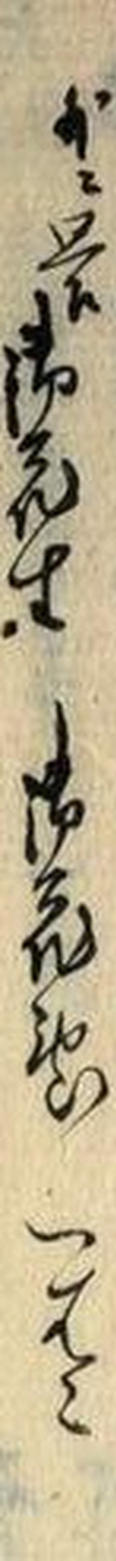御花生御花台一はこ
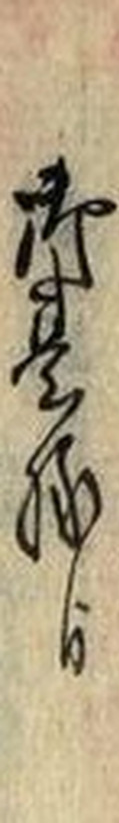御台様ゟ
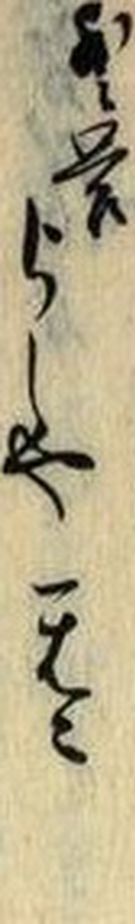らしや一はこ
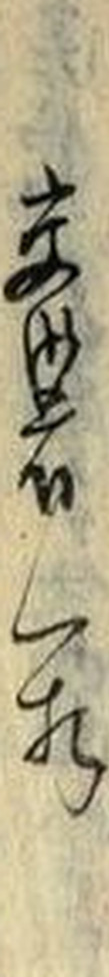交御肴一折
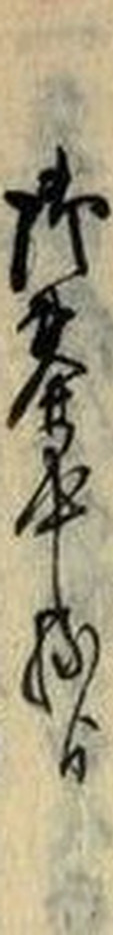御簾中様ゟ
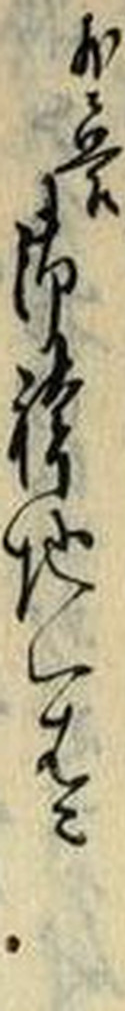御袴地一はこ
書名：少傅日録抄（斉承付側向頭取日記、在府）
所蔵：福井県文書館 Fukui Prefectural Archives
